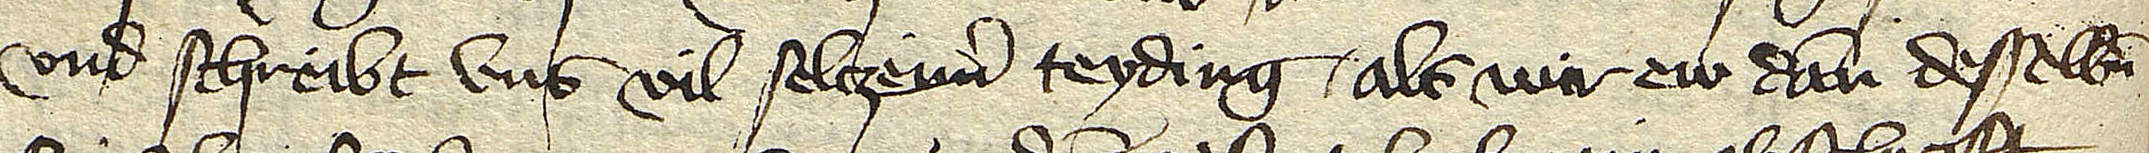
vnd ſchreibt vns vil ſelcʒeim* teyding / als wir ew dan* deſſelbn*
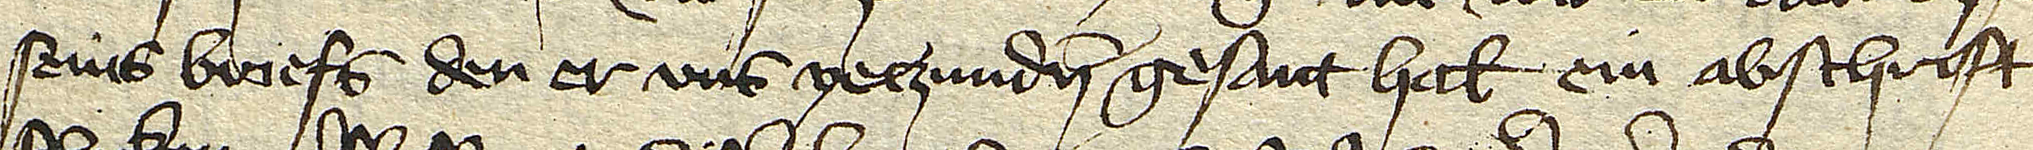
ſeins briefs den er vns yecʒundn* geſant hat ein abſchrift
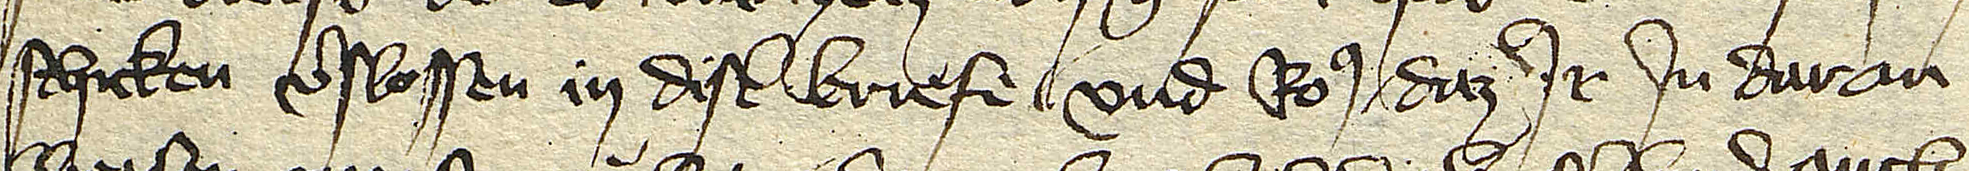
ſchicken v*ſloſſen in diſe* brief / vnd Ro* / daʒ Ir In daran
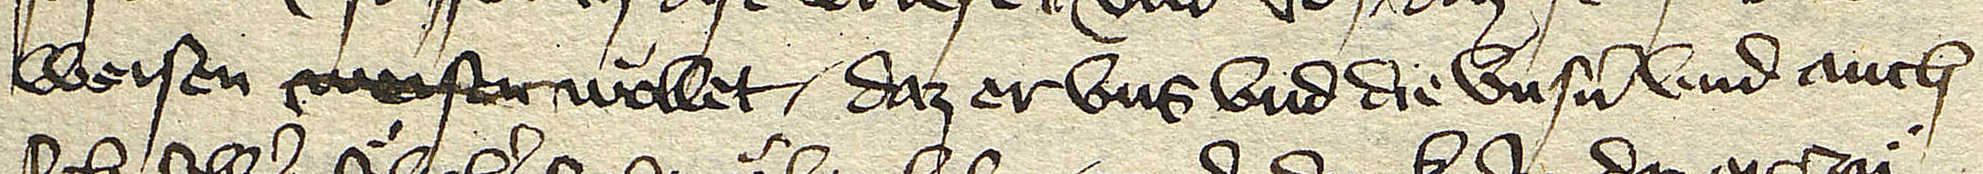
weiſen weiſen wöllet / daʒ er vns vnd die vnſn* vnd auch
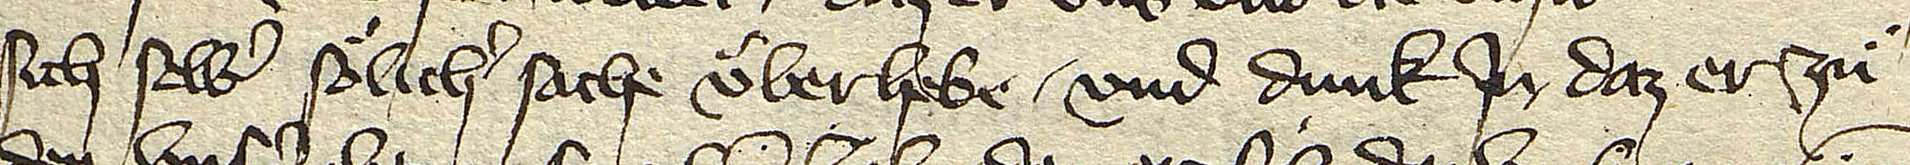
ſich ſelb* ſölich* ſache v̈berhebe / vnd dunk In / daʒ er cʒü
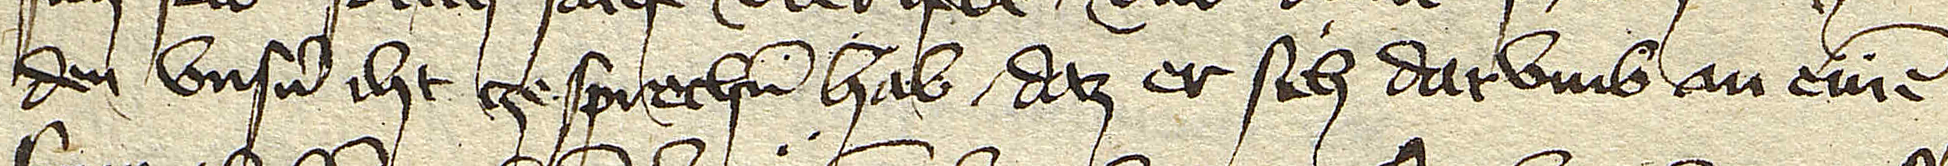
den vnſn* iht cʒeſprechn* hab / daʒ er ſich darvmb an eine*
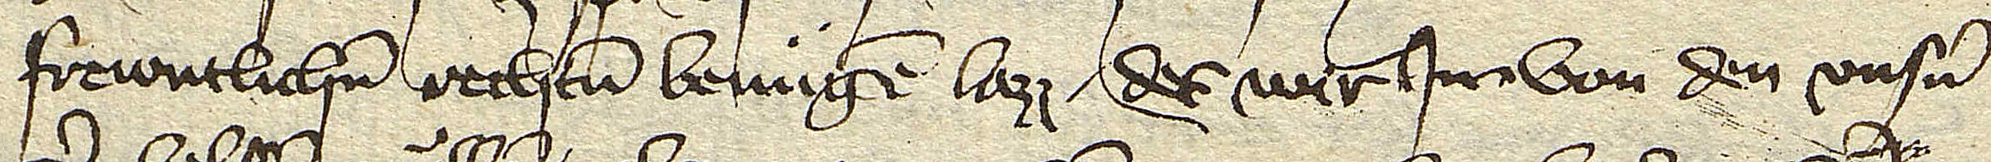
frewntlichn* rechtn* benüge* laʒʒ / des wir Im von den vnſn*
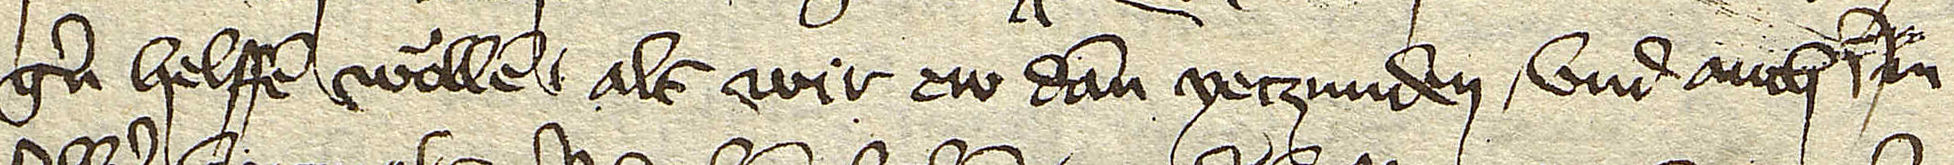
g*n helffe* wölle* / als wir ew dan* yecʒunden / vnd auch / Im
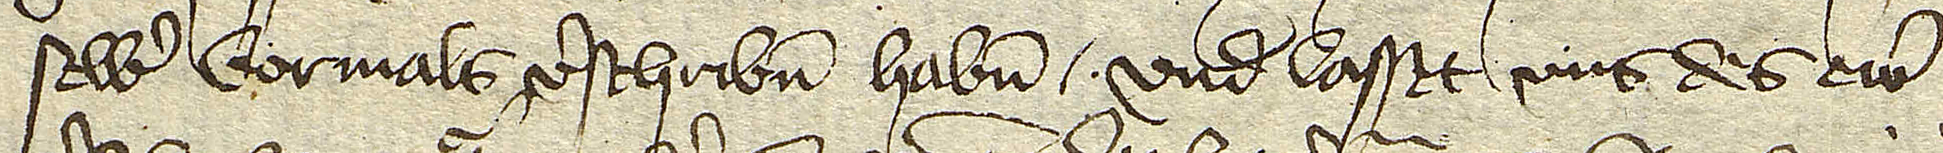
ſelb* vormals v*ſchribn* habn* / vnd laſſet vns des ew*
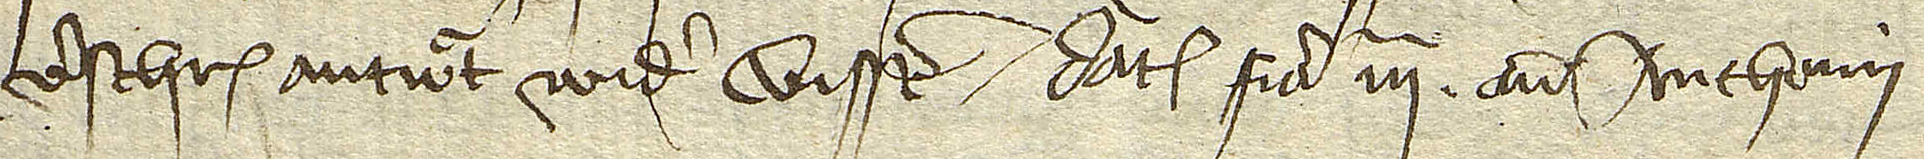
v*ſchr* antw*t wid* wiſſe* / dat* fia* iii* . an* Anthonii
